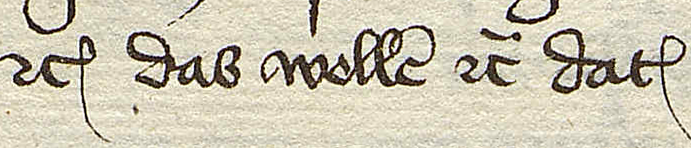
ec* das wolle* ec* dat*
